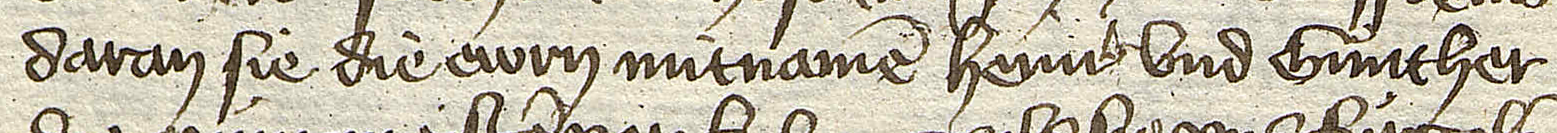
daran ſie die ewrn mitname* heinr* vnd Günther
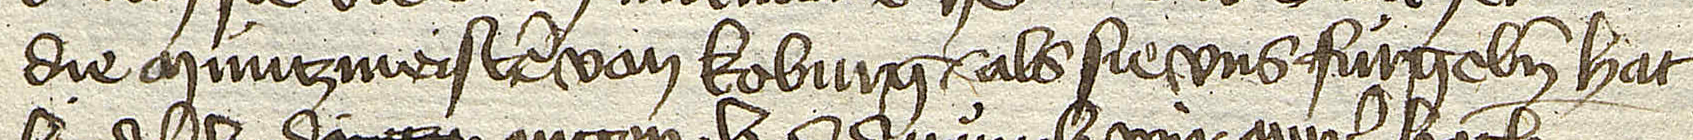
die Müncʒmeiſte* von Koburg / als ſie vns fürgebn* hat
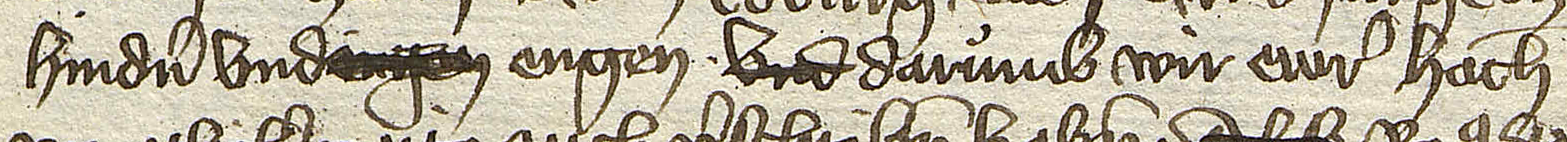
hindn* vnd engen engen . vnd darümb wir ewr* hoch*
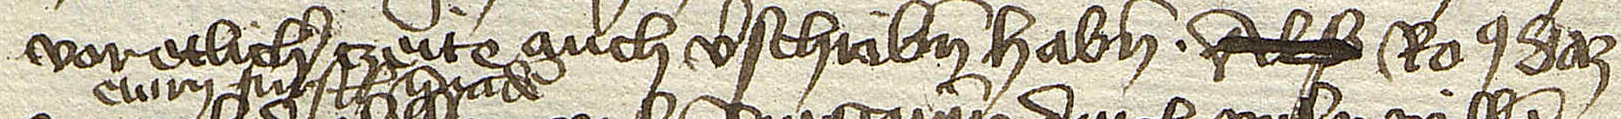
vor etlich* cʒeite auch v*ſchribn* habn* . Alſo Ro* daʒ
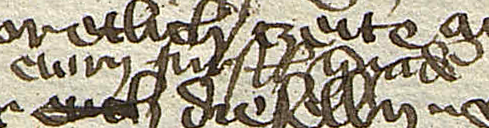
ewrn furſtl* gnad*
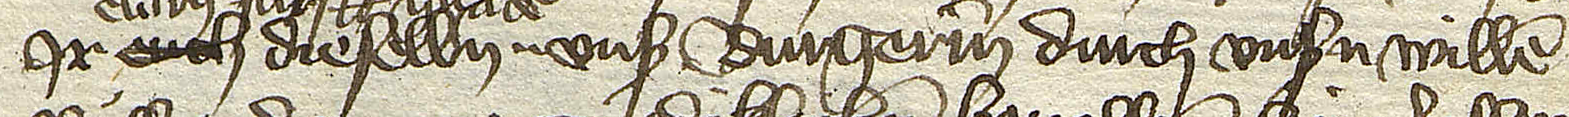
Ir euch dieſelbn* ~ vnſ* Burgerin* durch vnſ*n wille*
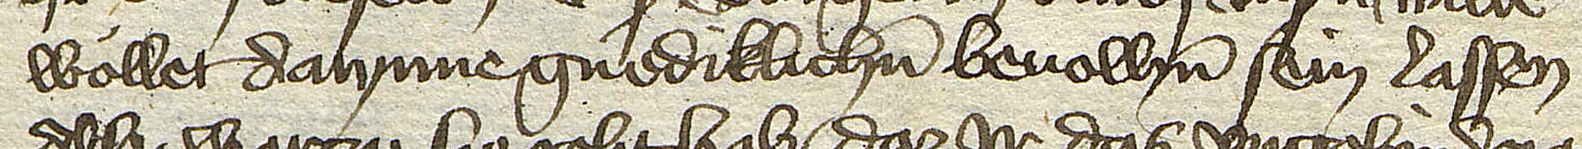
wöllet darynne gnediklichn* beuolhn* ſein laſſen
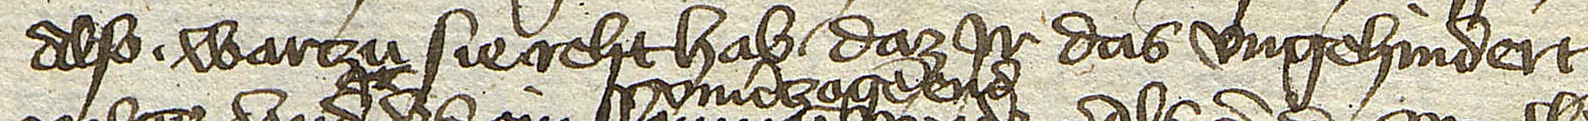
Alſo . warcʒu ſie reht hab / daʒ Ir das vngehindert
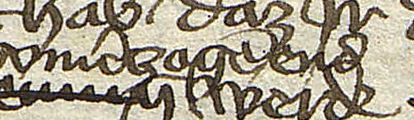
vnu*cʒoge* end
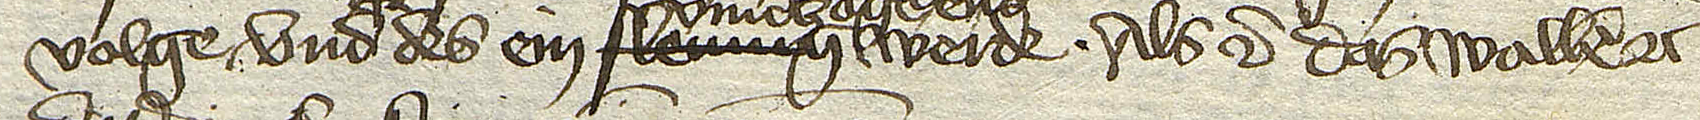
volge / vnd des ein ſleunig werde . Als ec* das wolle* ec*
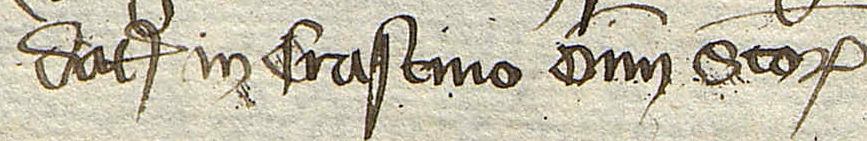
Dat* in Craſtino Omi* Sco*
